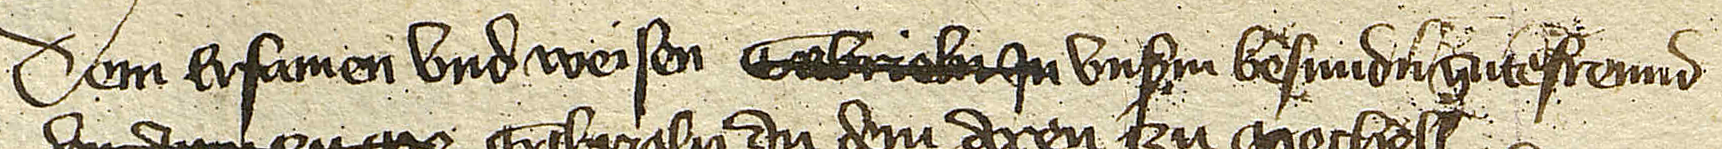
Dem Erſamen vnd weiſen Gabrieln In vnſ*m beſundn* gute* freund
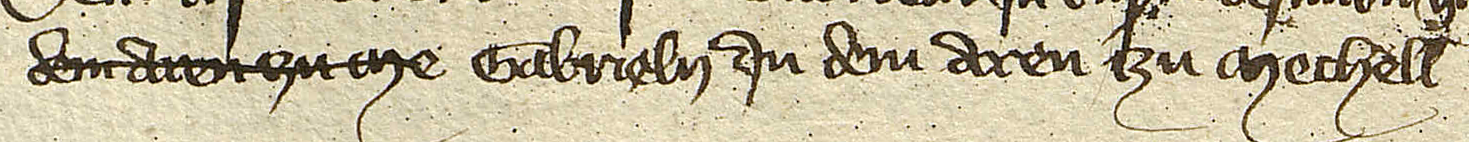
dem Aren cʒu Me Gabrieln In dem Aren cʒu Mechell
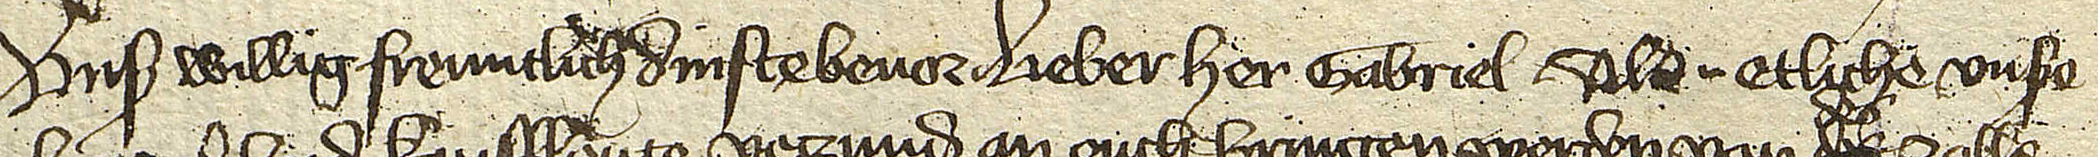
Vnſ* willig freuntlich dinſte beuor Lieber her Gabriel / Als ~ etliche vnſ*e
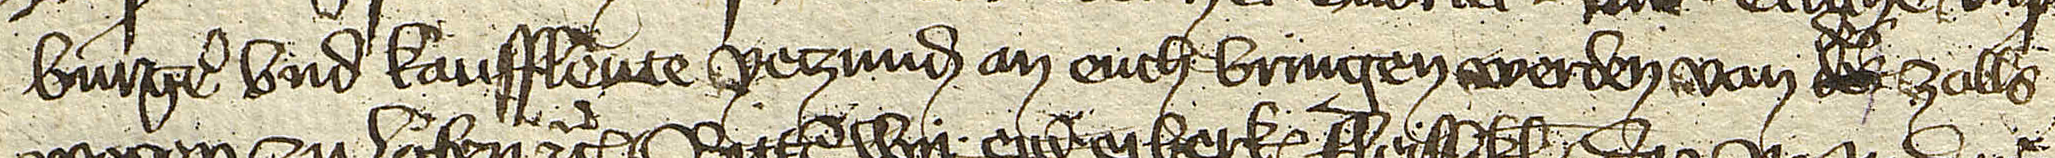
burge* vnd kauffleute yecʒund* an euch bringen werden von des cʒolls
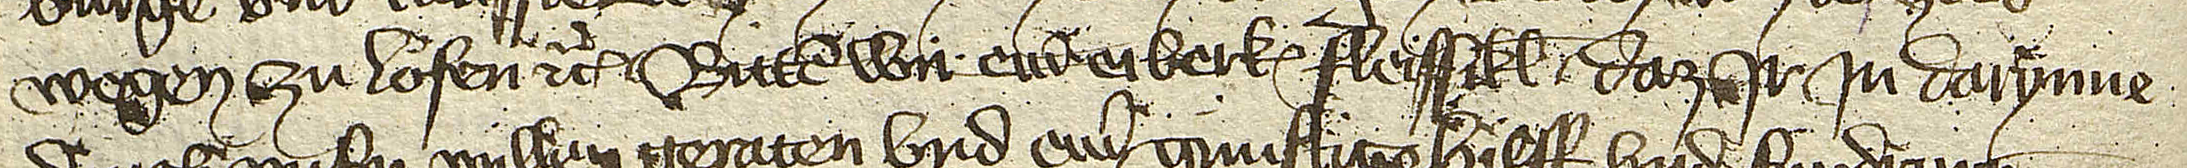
wegen cʒu löſen ec* / Bitte* wir ew* erberk* fleiſſikl* / daʒ Ir In darynne
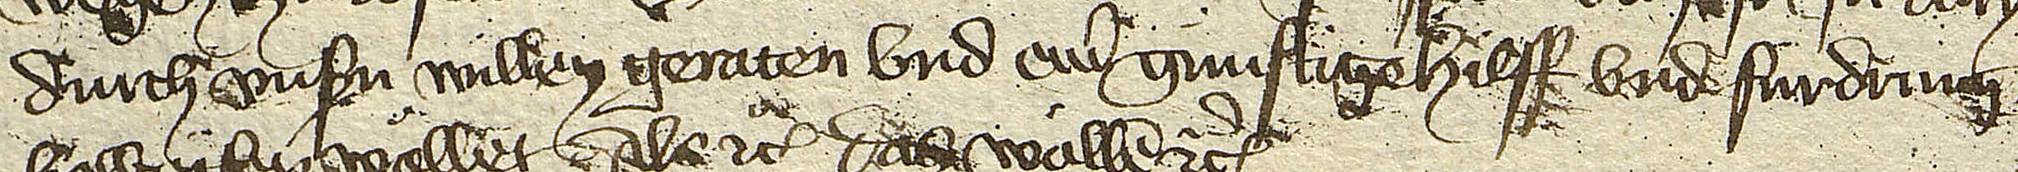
durch vnſ*n willen geraten vnd ew* günſtige hilff vnd fürdrung
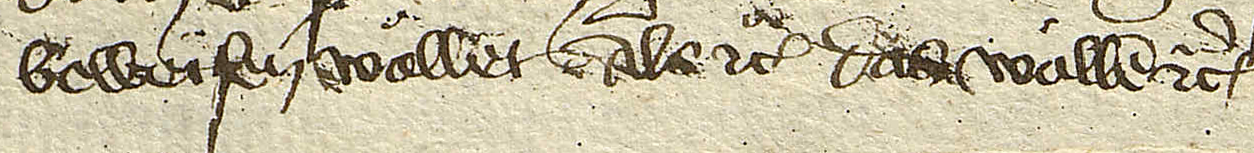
beweiſen wöllet / Als ec* das wölle* ec*
